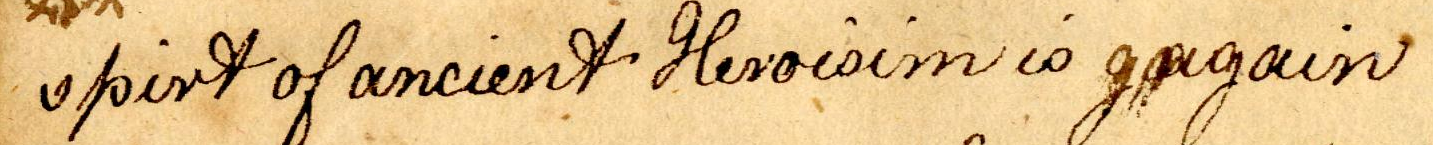spirit of ancient Heroisim is g again
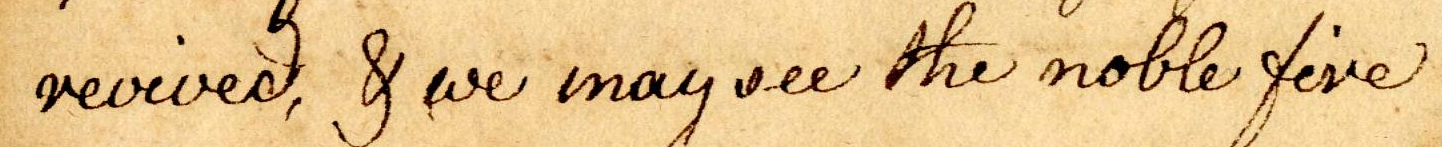revived, & we may see the noble fire
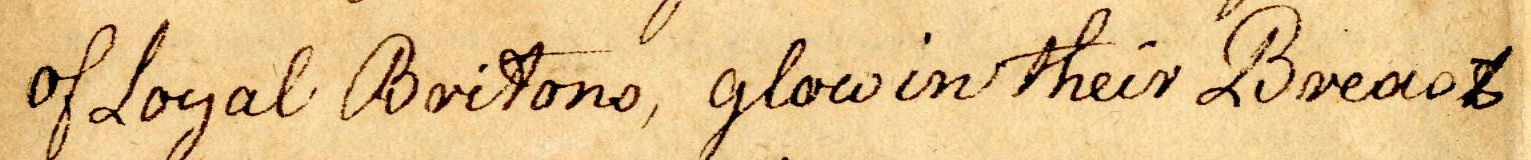of Loyal Britons, glow in their Breasts
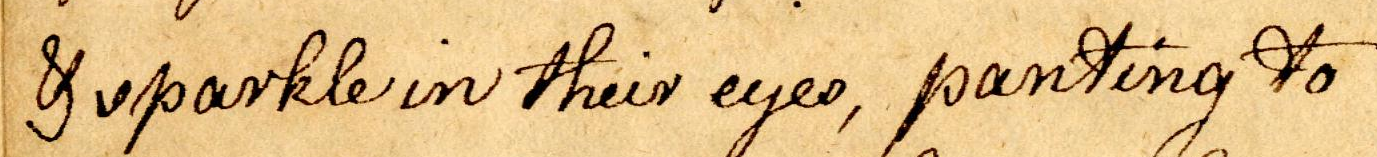& sparkle in their eyes, panting to
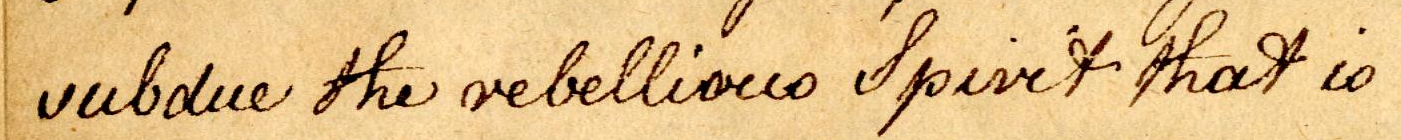subdue the rebellious Spirit that is
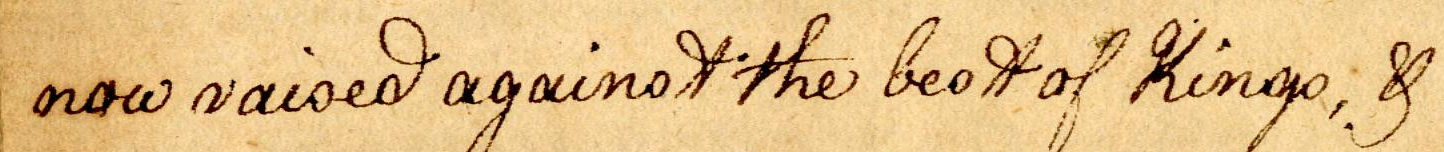now raised against the best of the Kings, &
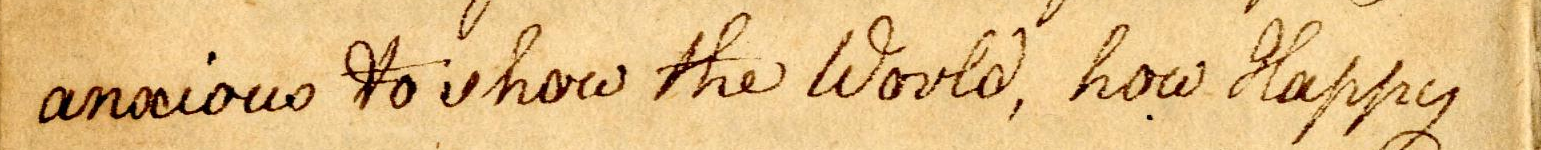anxious to show the World, how Happy
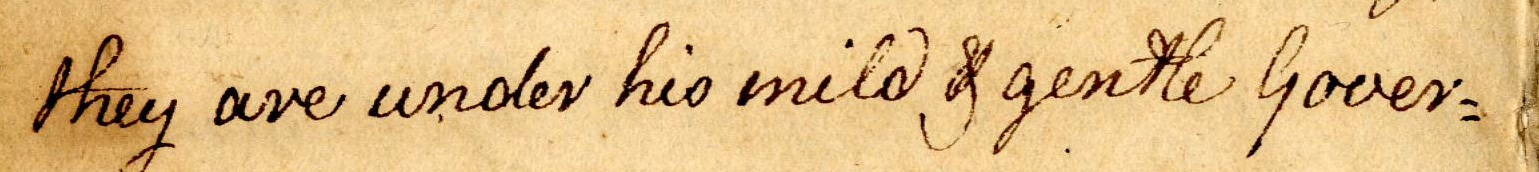they are under his mild & gentle Gover-
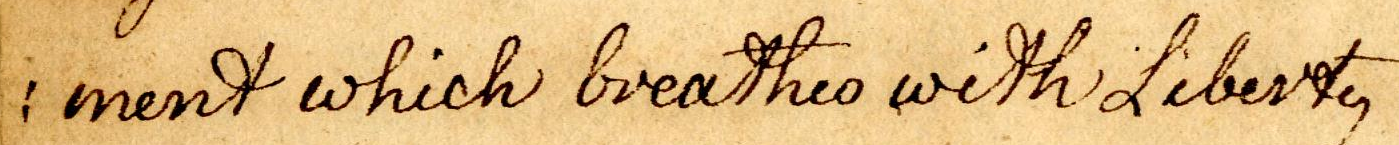-ment which breathes with Liberty
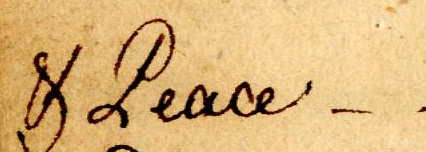& Peace-
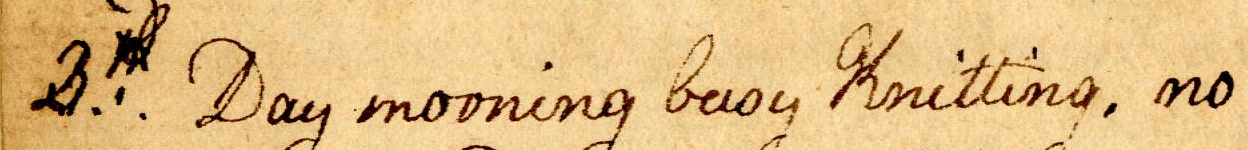3^d Day morning busy Knitting, no
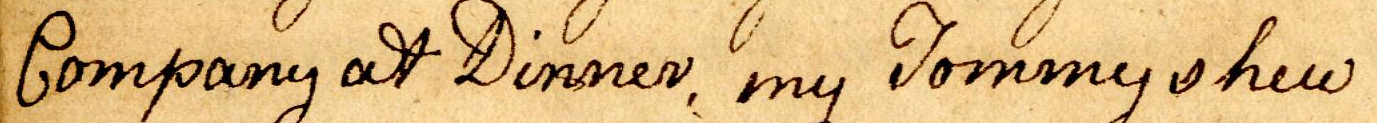Company at Dinner, my Tommy shew
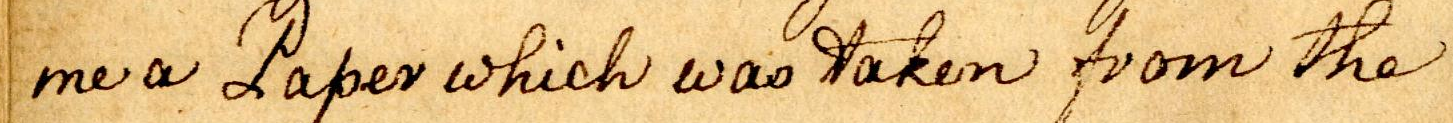me a Paper which was taken from the
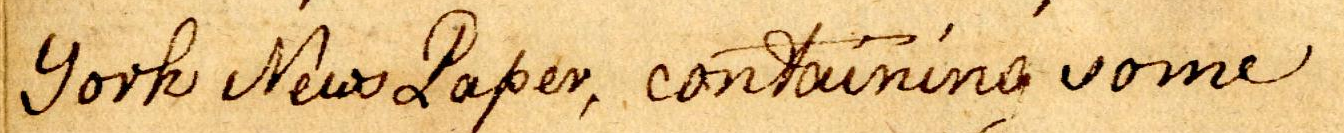York News Paper, containing some
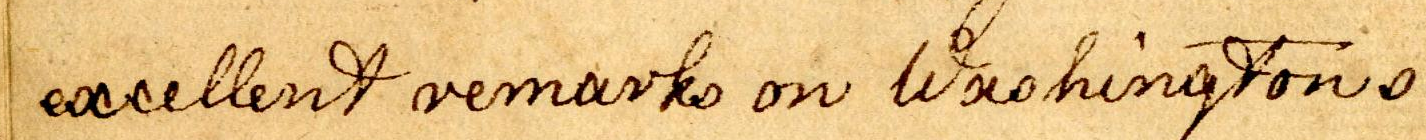excellent remarks on Washingtons
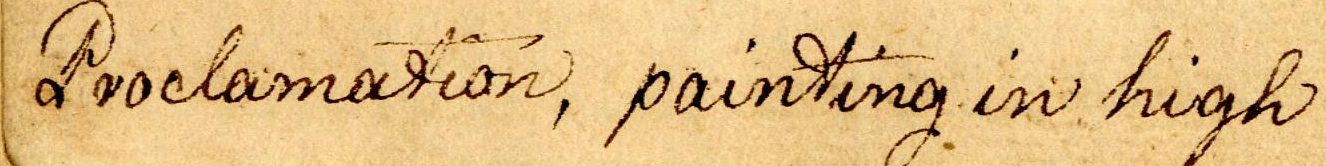Proclamation, painting in high
